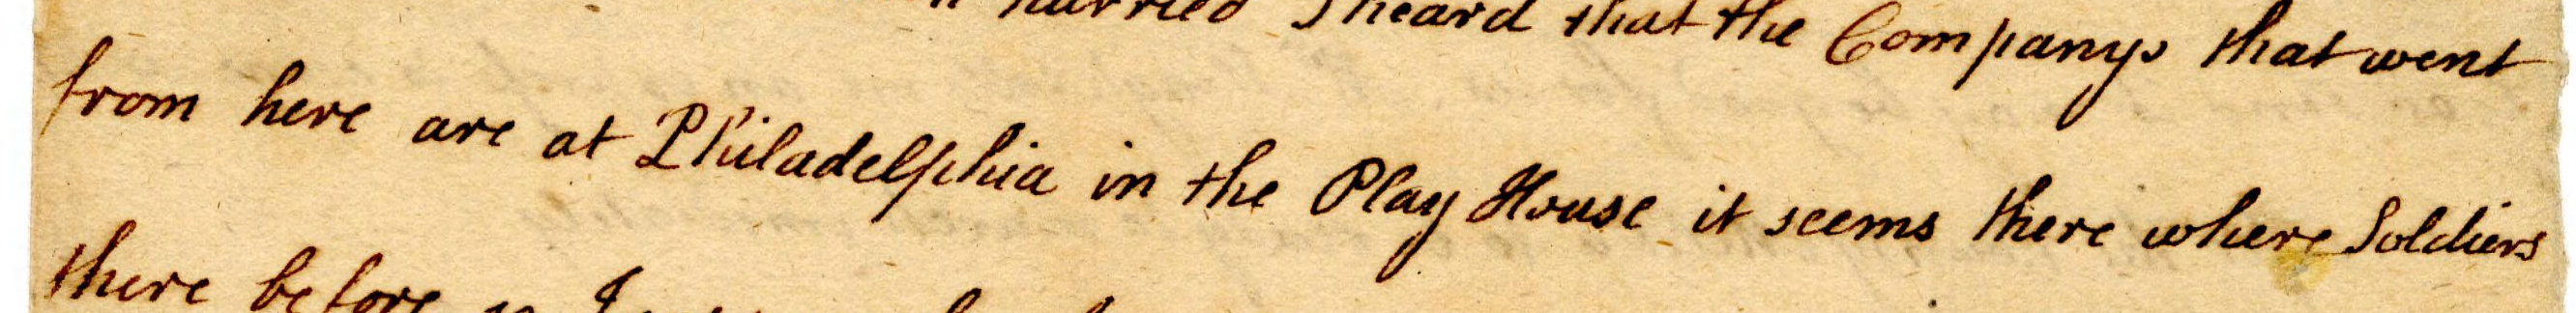from here are at Philadelphia in the Play House it seems there where Soldiers
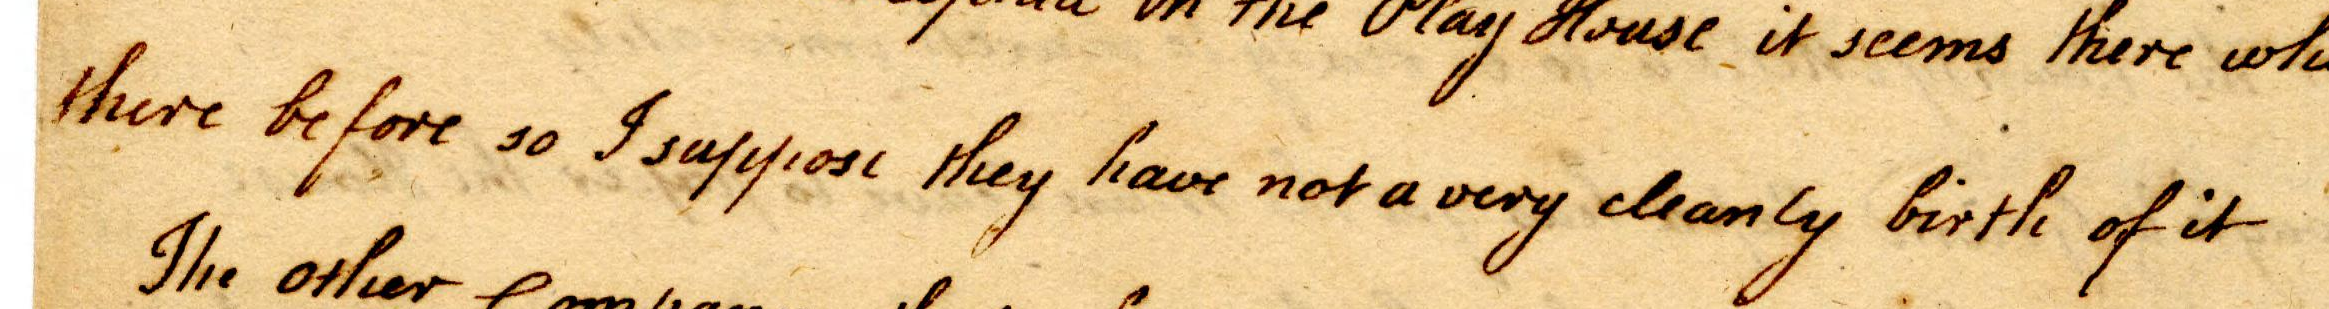there before so I suppose they have not a very cleanly birth of it
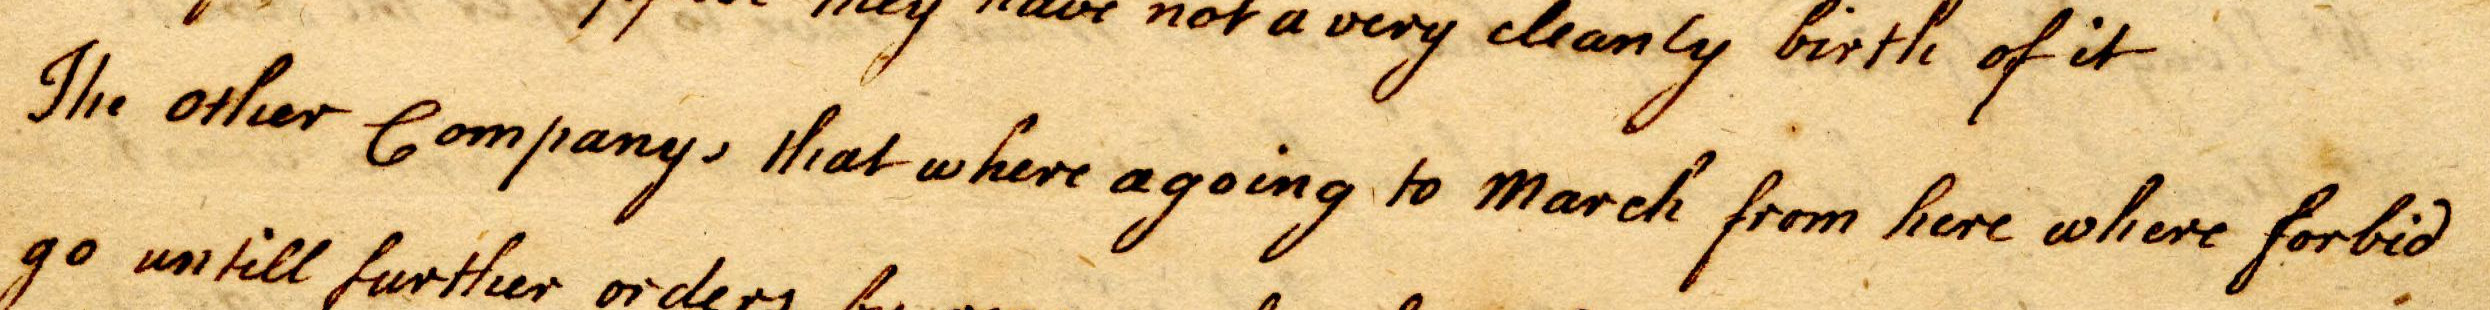The other Companys that where agoing to March from here where forbid
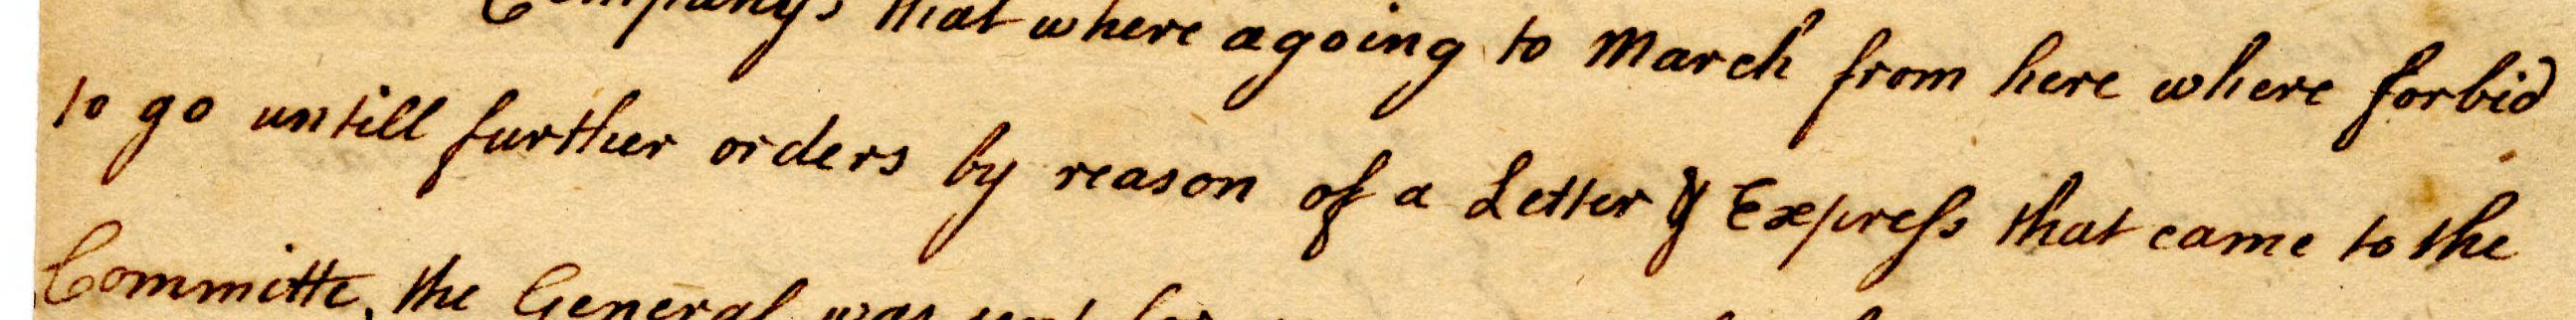to go untill further orders by reason of a Letter & Express that came to the
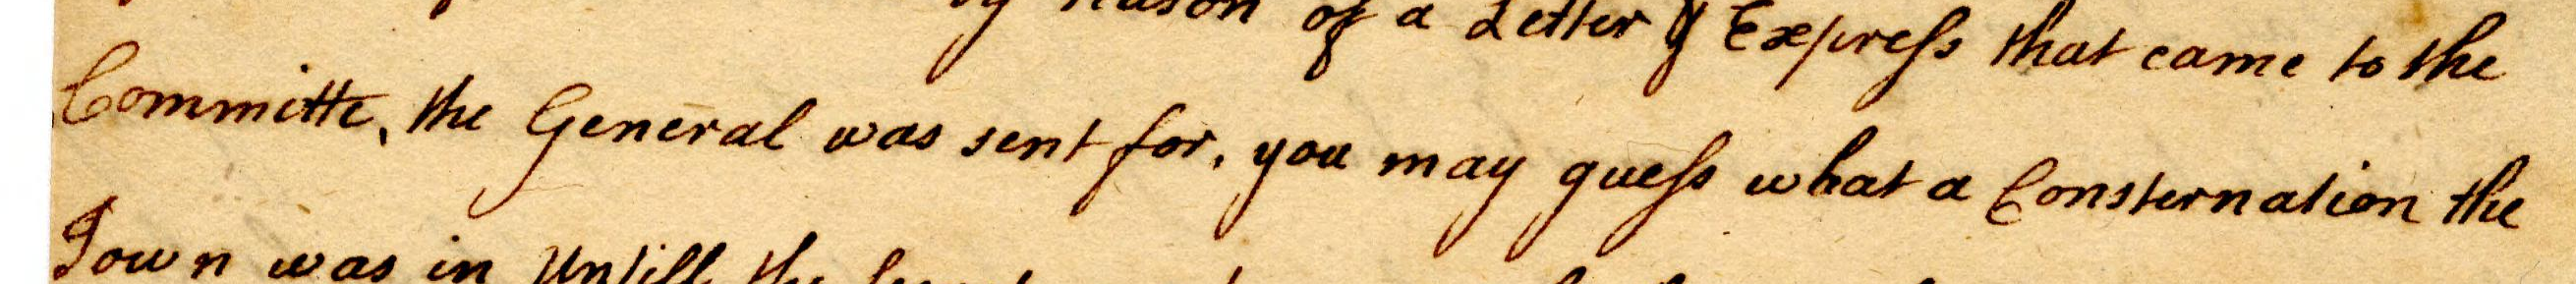Committee, the General was sent for you may guess what a Consternation the
